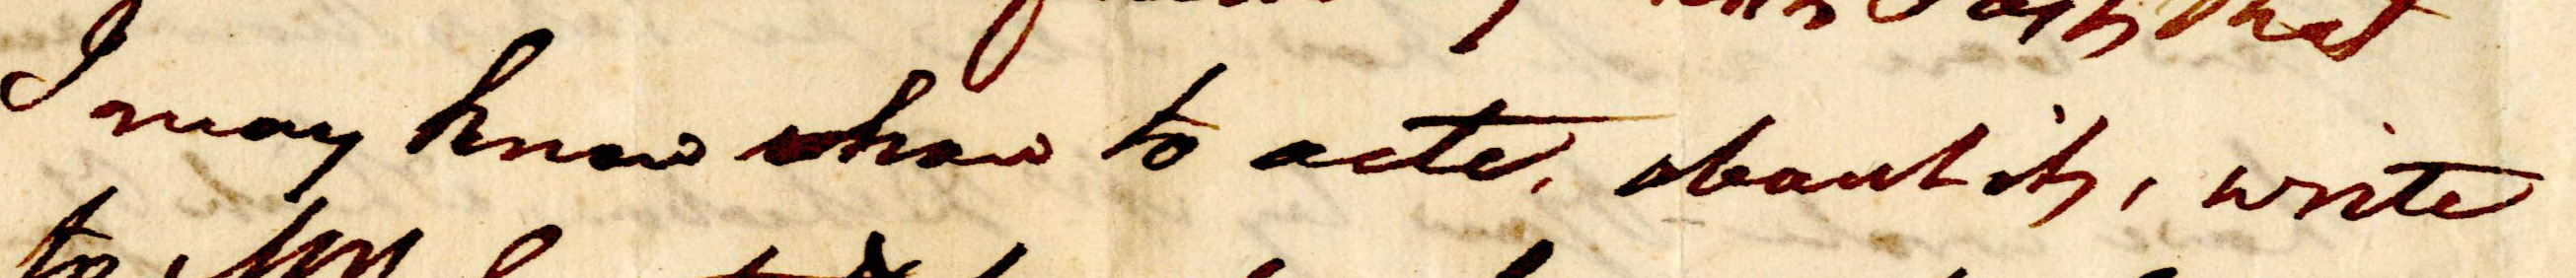I may Know what to write, about it, write
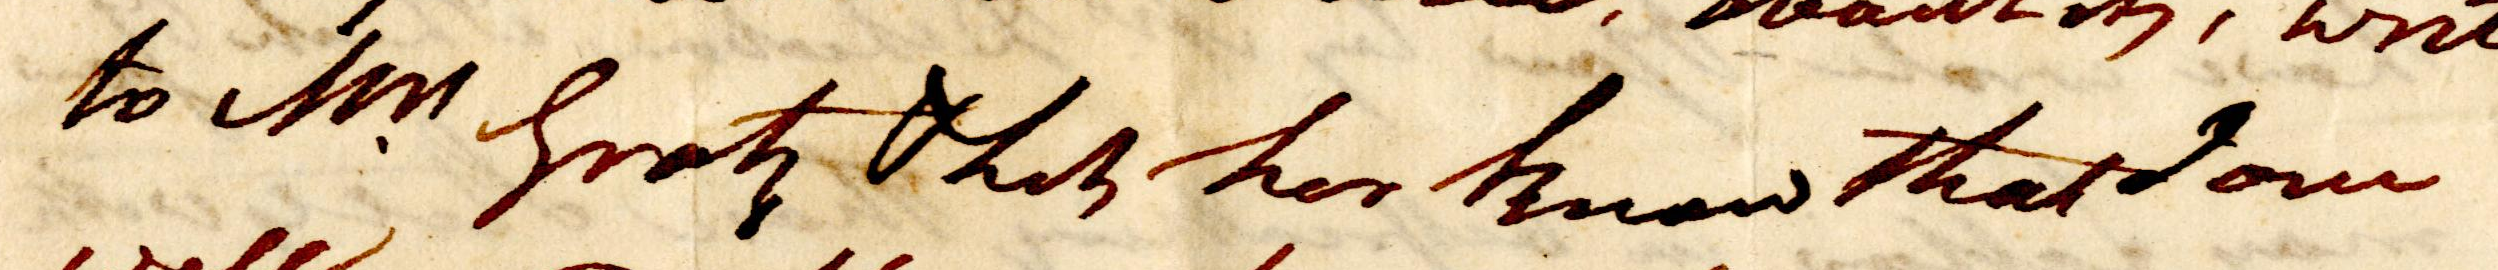to M^rs Gratz & Let her know that I am
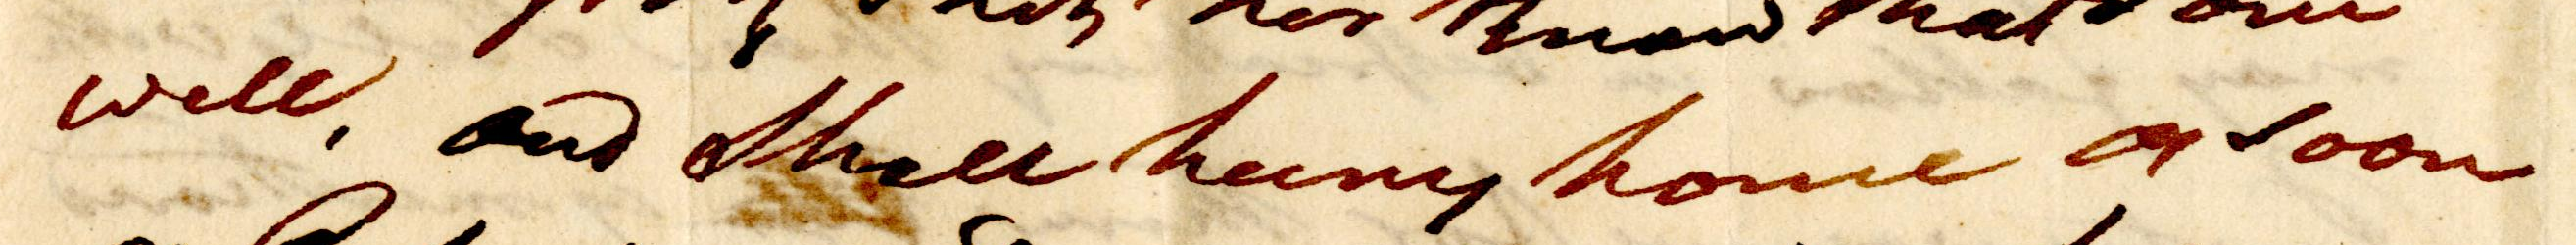well, and shall hurry home as soon
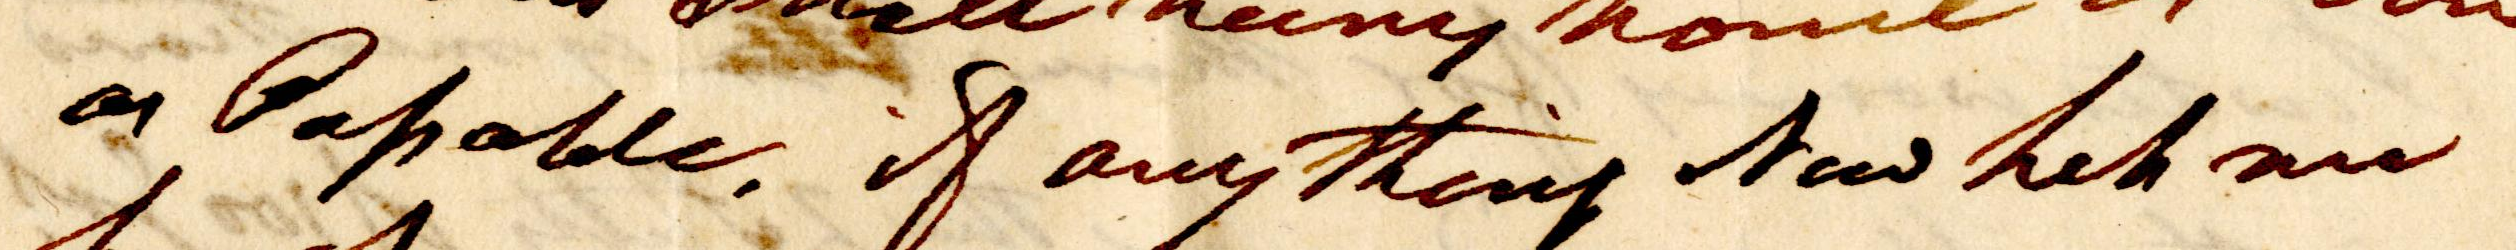as Possable, if any thing Now Let me
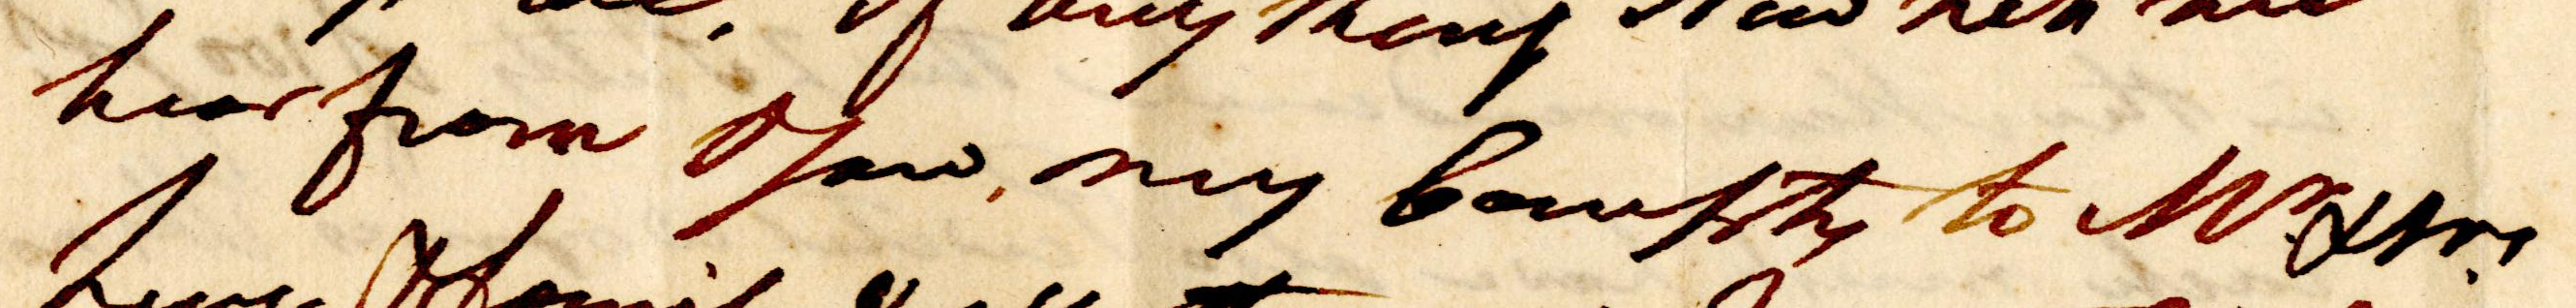hear from you, my compl^ts to M^r & M^rs
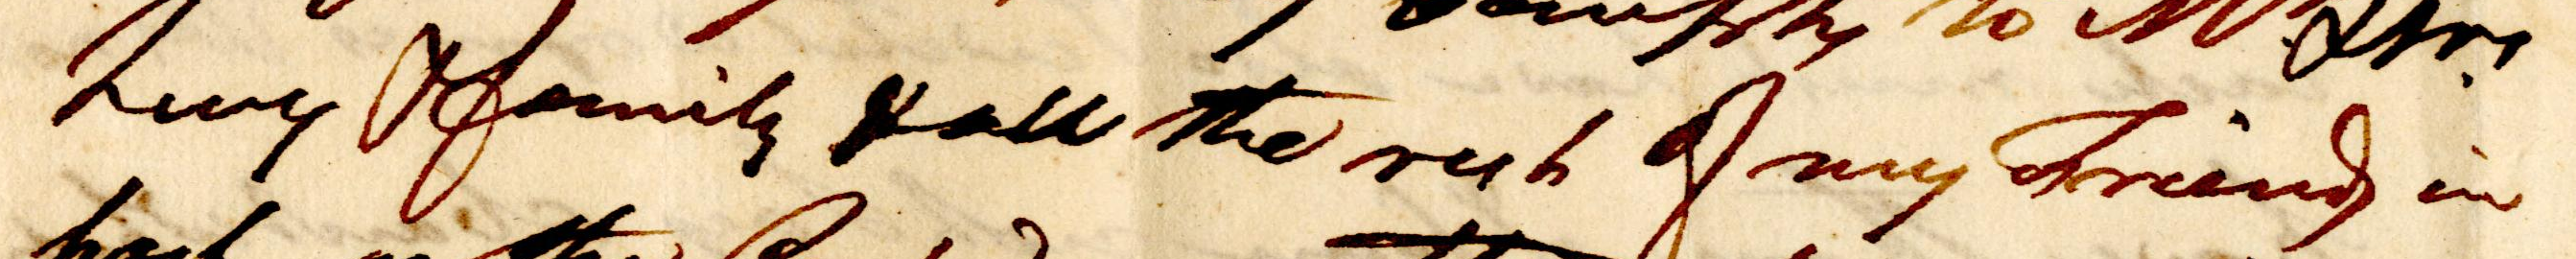Levy & family & all the rest of my Friends in
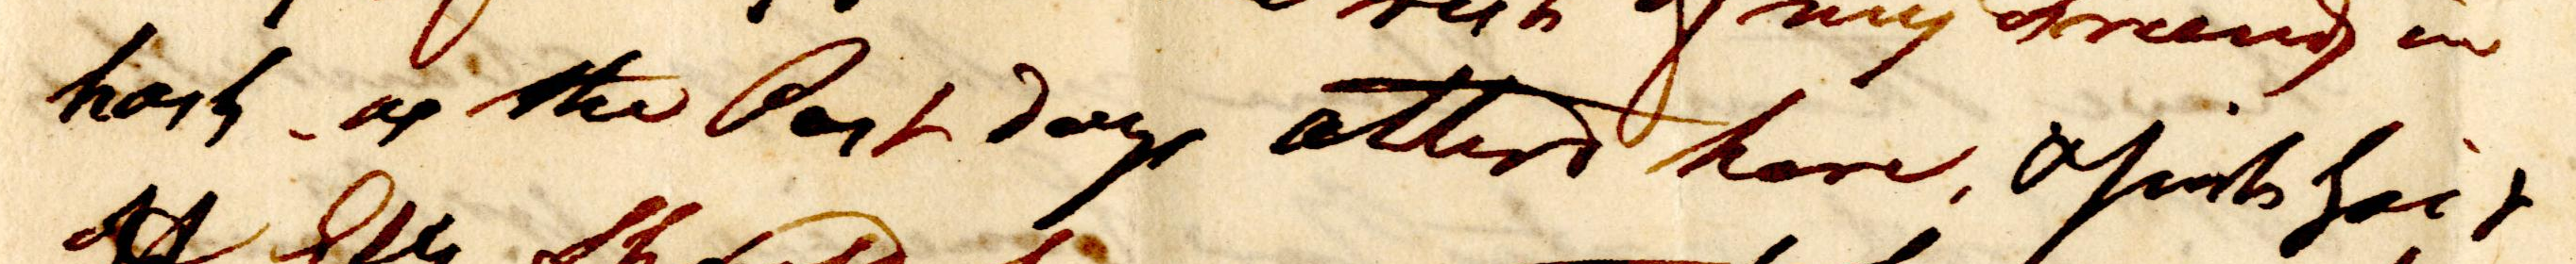haste, as the Past day attend here & first Goig
